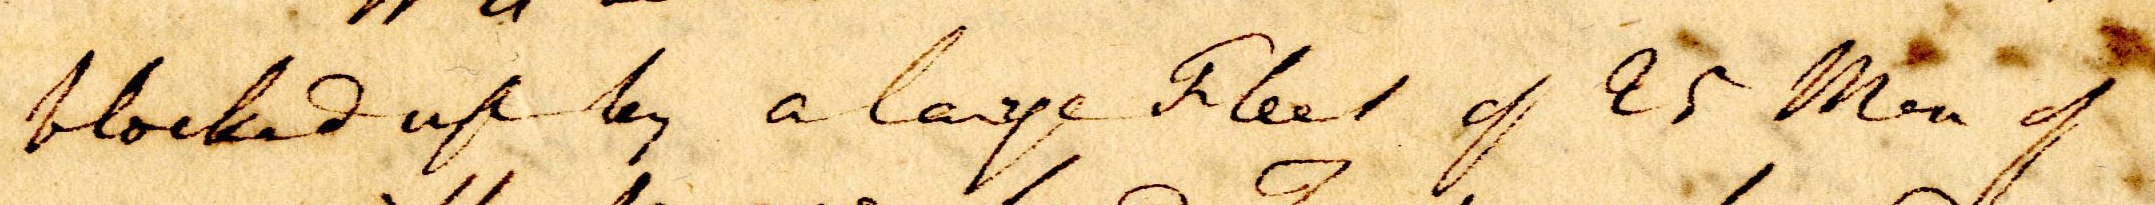blocked up by a large Fleet of 25 Men of
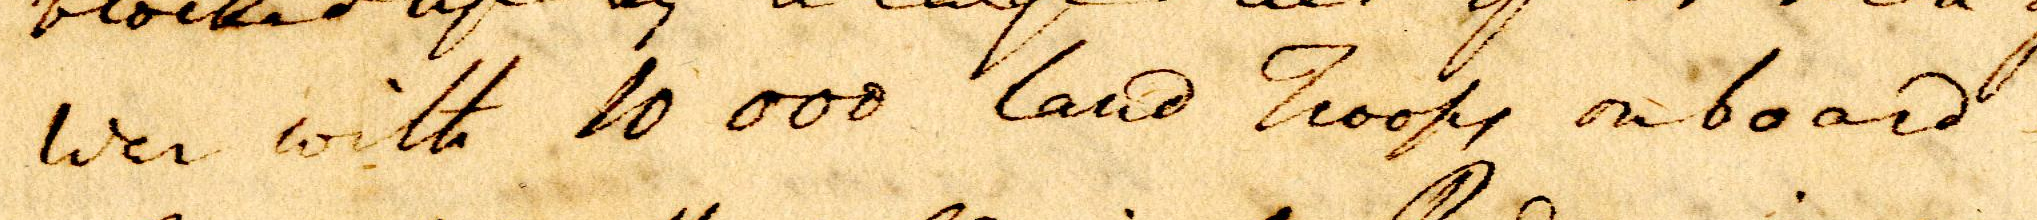War with 10 000 land troops onboard
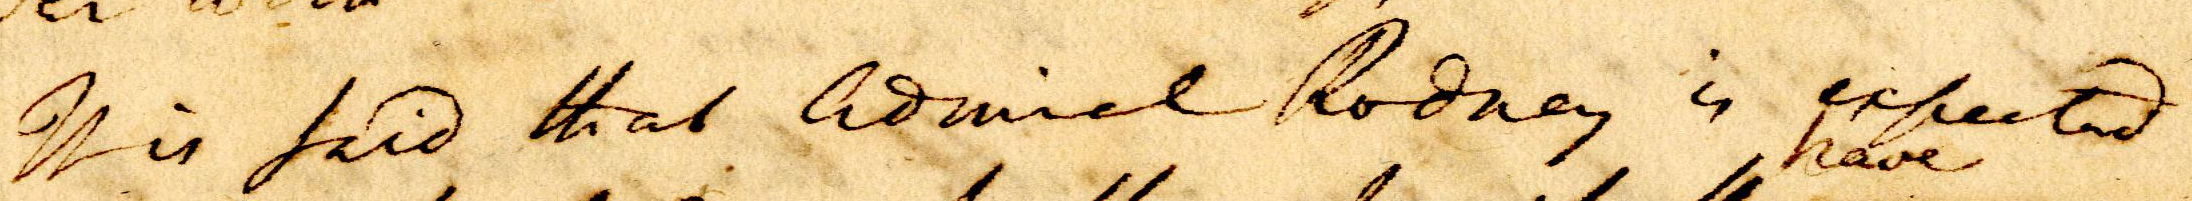It is said that Admiral Rodney is expected
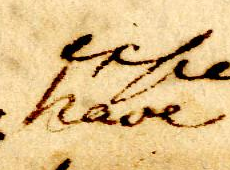have
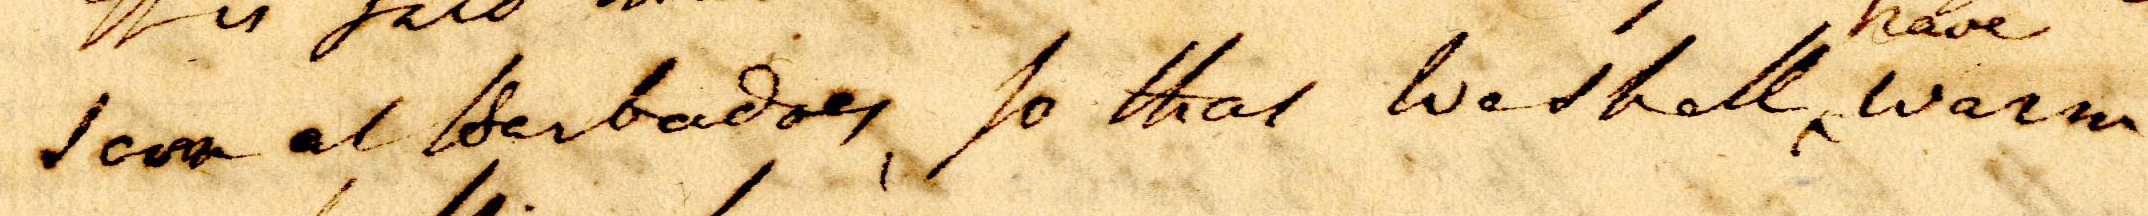soon at Barbadoes, so that we shall ^ warm
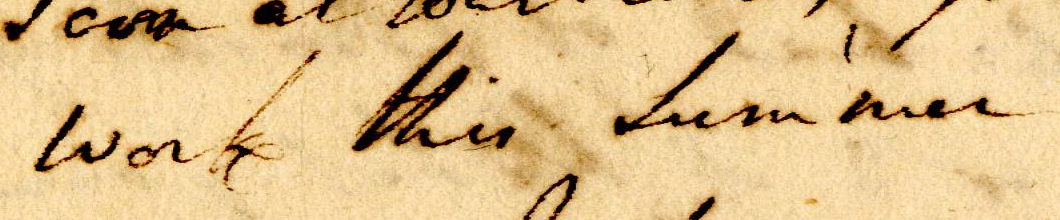work this summer
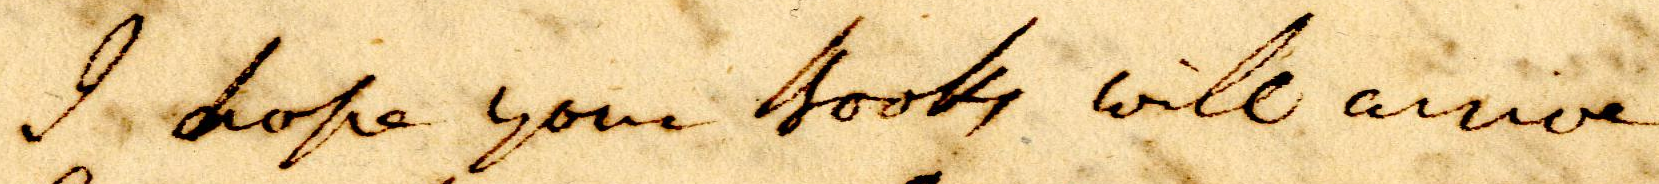I hope your books will arrive
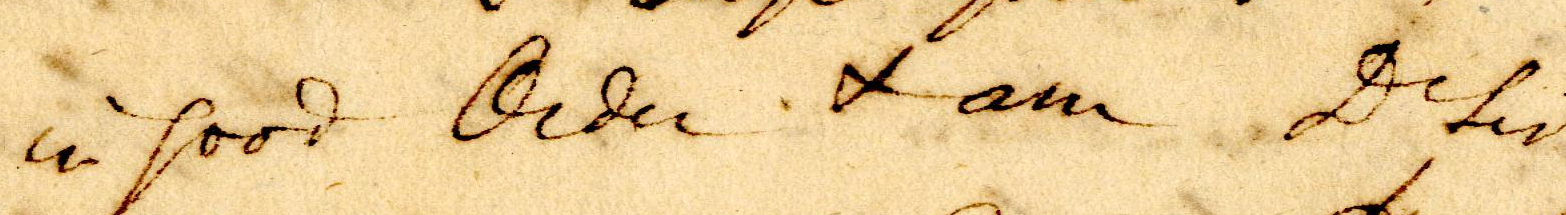in good Order & am D^r Sir
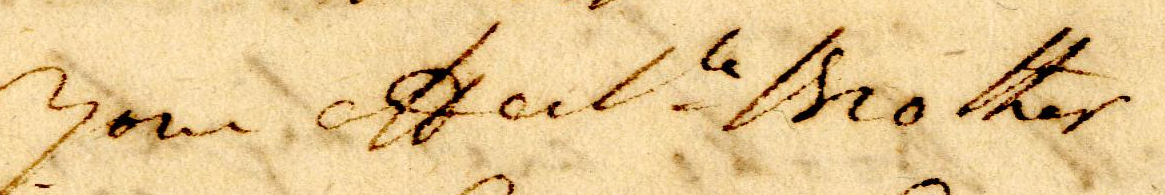Your affect^e Brother
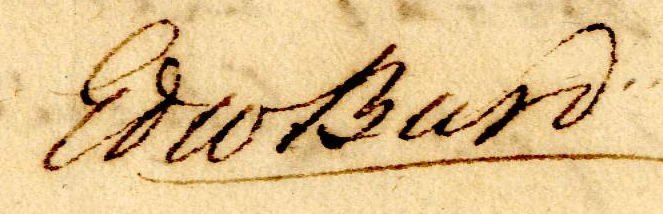Edw. Burd
